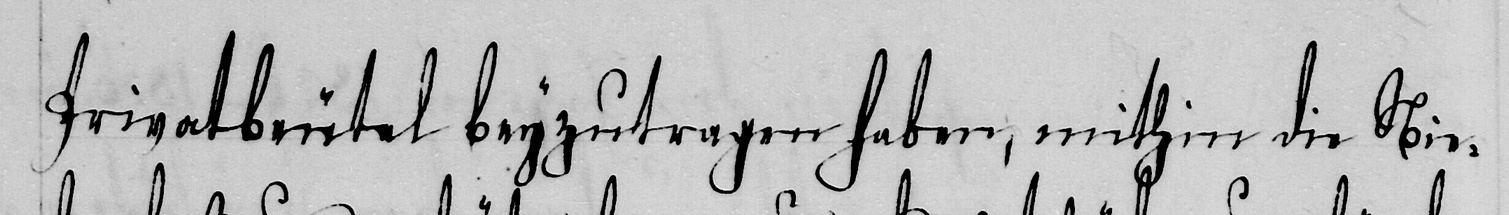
Privatbeutel beyzutragen haben, mithin die Nie¬
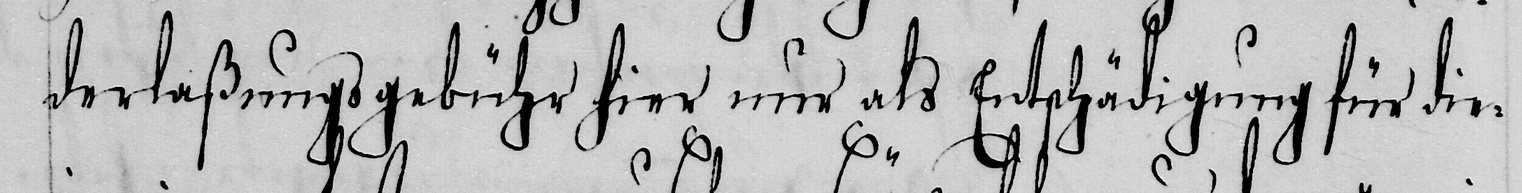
derlaßungsgebühr hier nur als Entschädigung für die¬
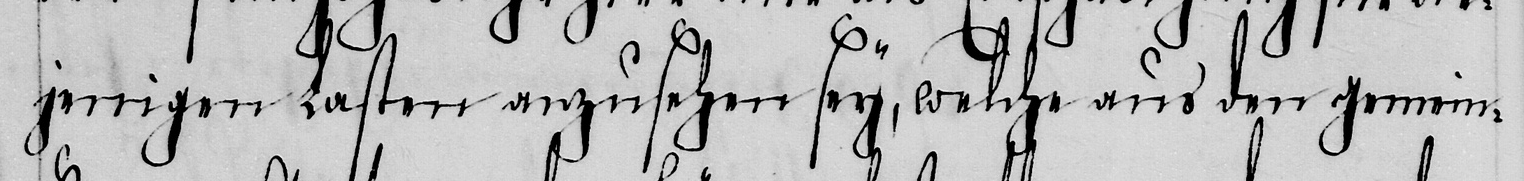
jenigen Lasten anzusehen sey, welche aus den gemein¬
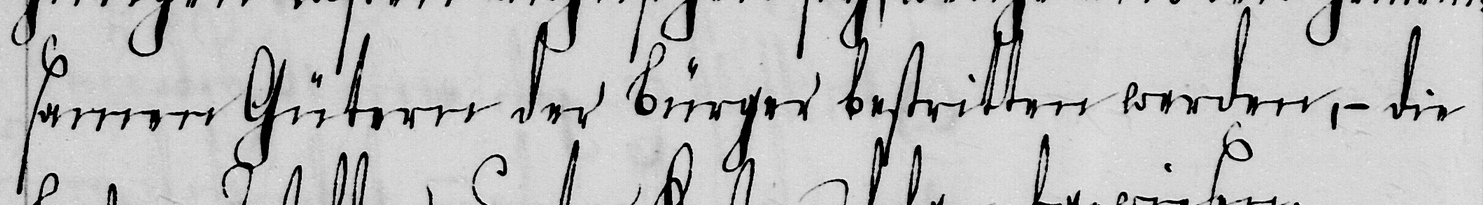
samen Gütern der Bürger bestritten werden, – die
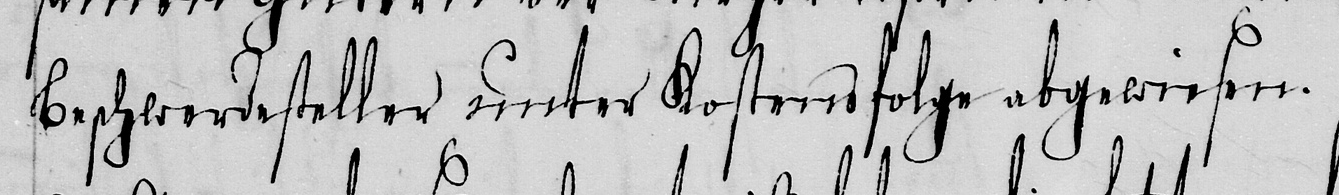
Beschwerdesteller unter Kostensfolge abgewiesen.
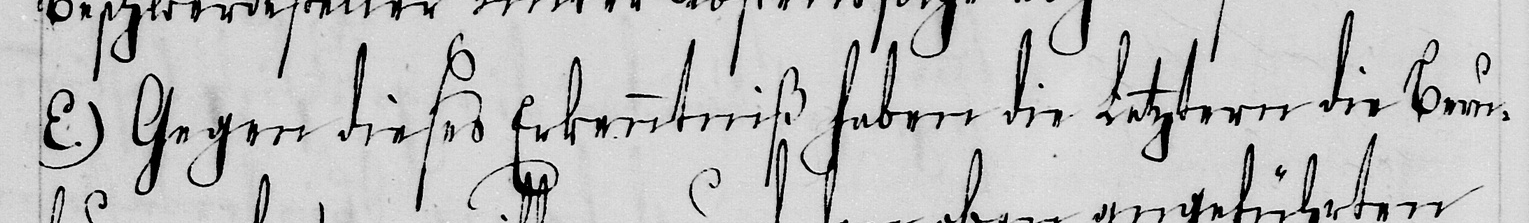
E.) Gegen dieses Erkenntniß haben die Letztern die Ber¬
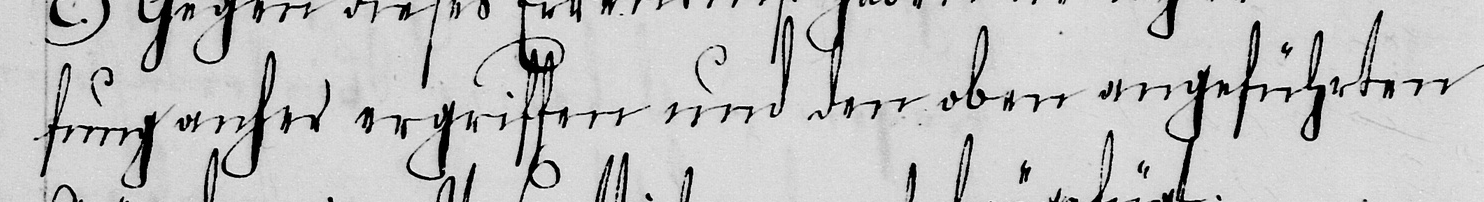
ufung anher ergriffen und den oben angeführten
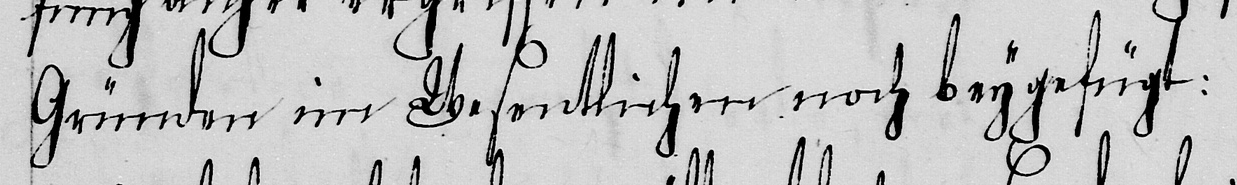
Gründen im Wesentlichen noch beygefügt:
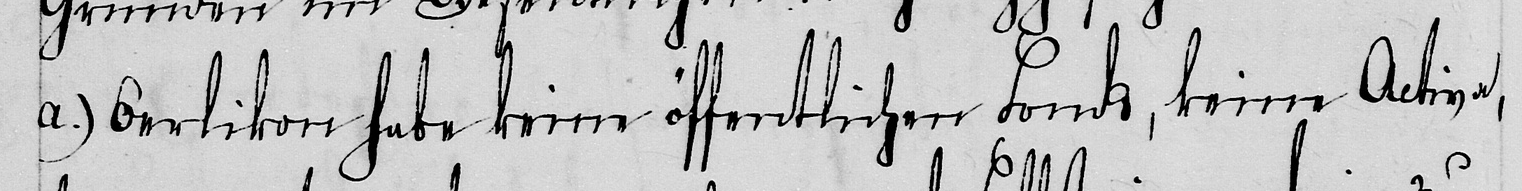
a.) Oerlikon habe keine öffentlichen Fonds, keine Activa,
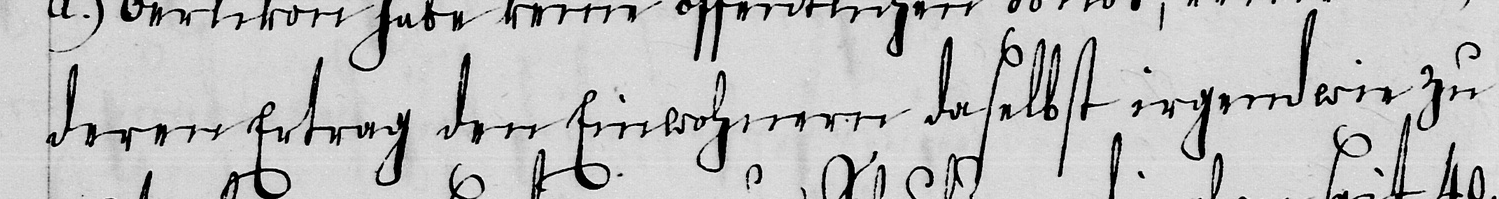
deren Ertrag den Einwohnern daselbst irgendwie zu
